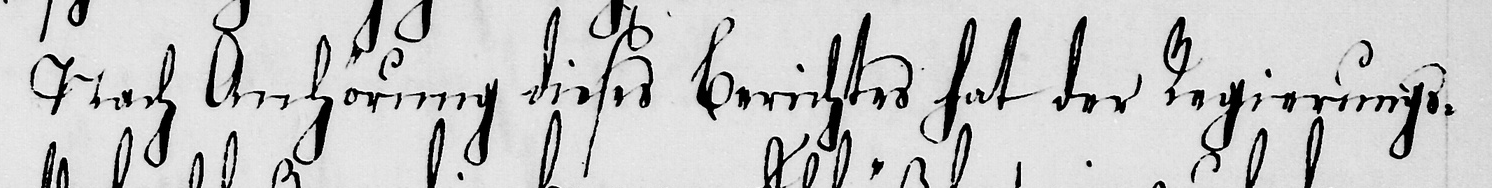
Nach Anhörung dieses Berichtes hat der Regierungs¬
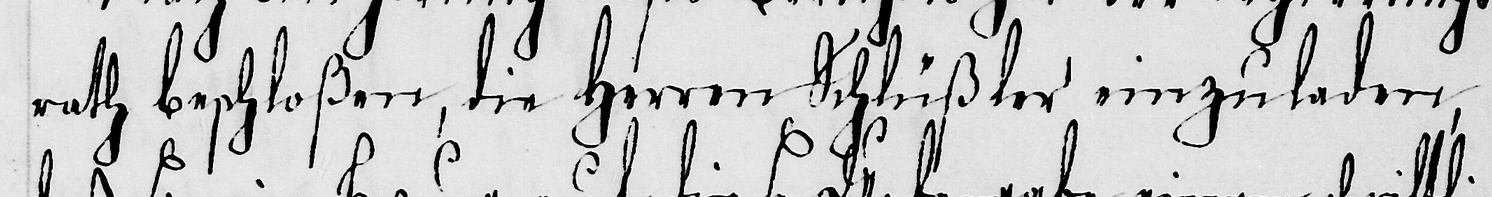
rath beschloßen, die Herren Schlüßler einzuladen,
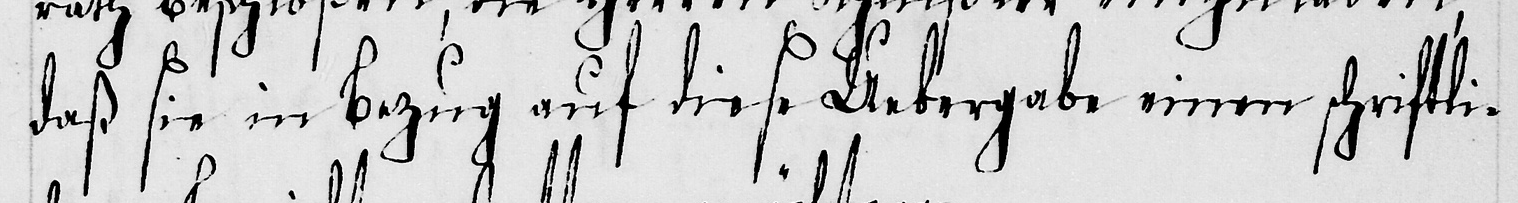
daß sie in Bezug auf diese Uebergabe einen schriftli¬
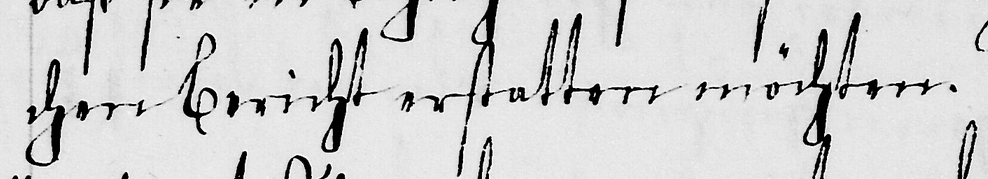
chen Bericht erstatten möchten.
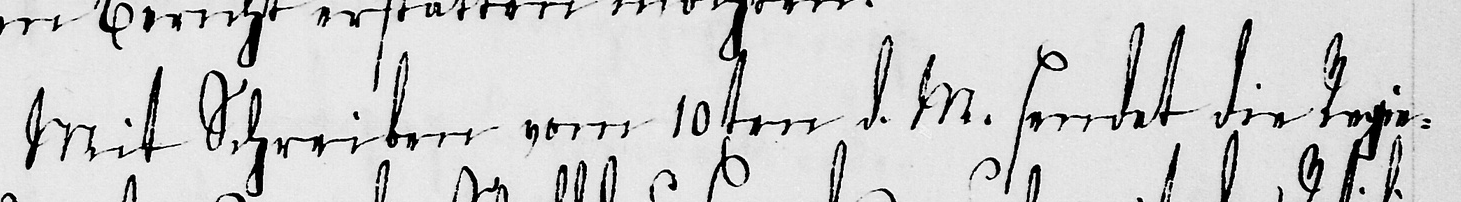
Mit Schreiben vom 10ten d. M. sendet die Regie¬
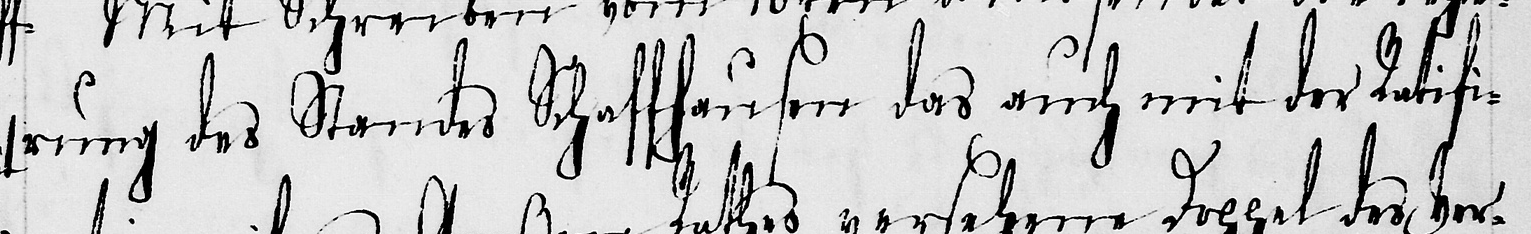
rung des Standes Schaffhausen das auch mit der Ratif¬
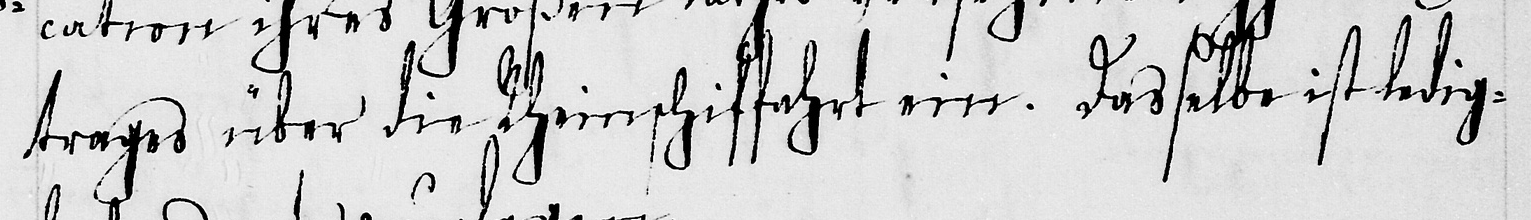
trages über die Rheinschiffahrt ein. Dasselbe ist ledig¬
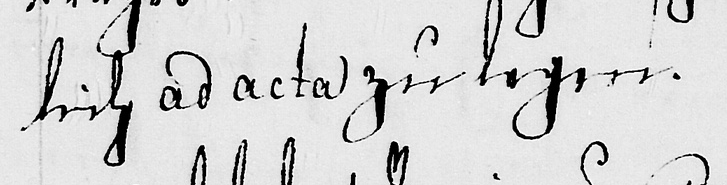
lich ad acta zu legen.
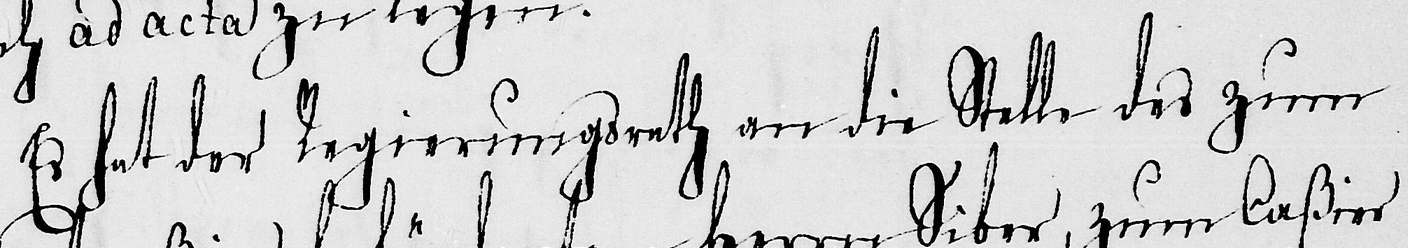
Es hat der Regierungsrath an die Stelle des zum
